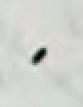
„
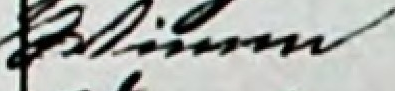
Wimm
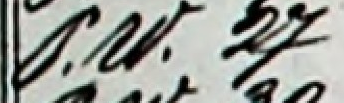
P.W. 27
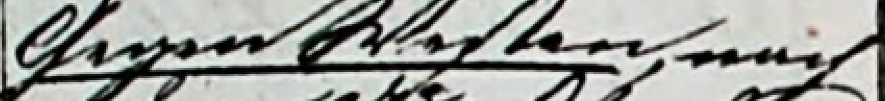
Gegen Westen, nach
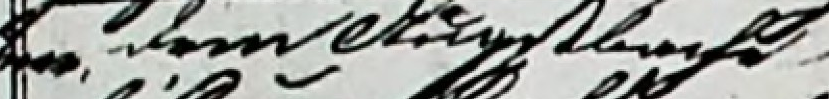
dem Augstbache
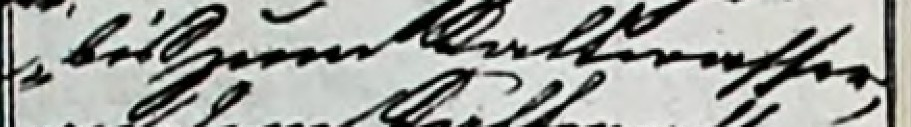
bis zum Kaltwasser,
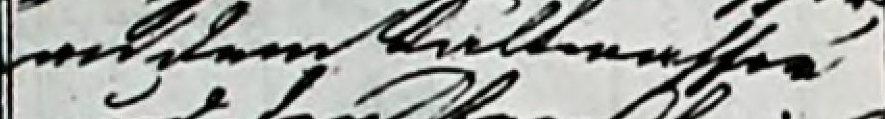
an dem Kultwasser
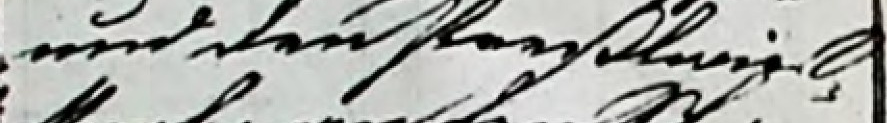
und den Preßlwies„
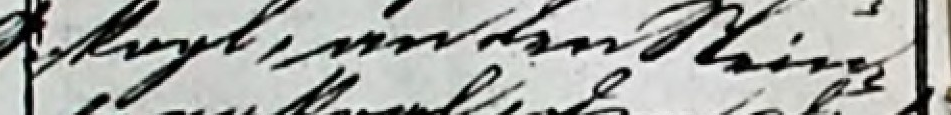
kogl, an den Stein„
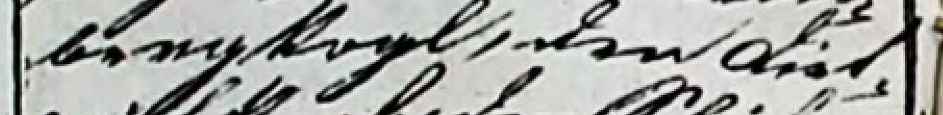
bergkogl, den Diet„
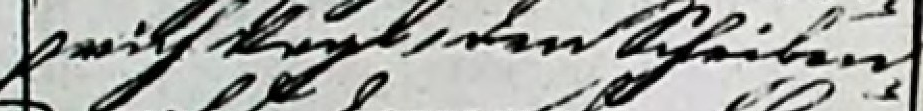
rich kogl, den Scheiben„
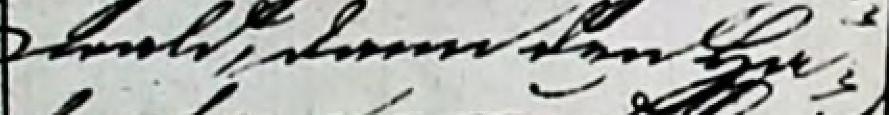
wald, dann den Ha„
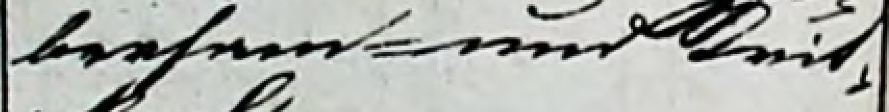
bersam- und Krit„
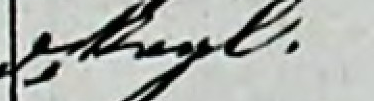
„kogl.
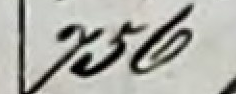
756
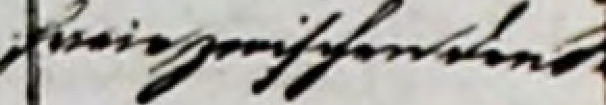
Frei zwischen den S
